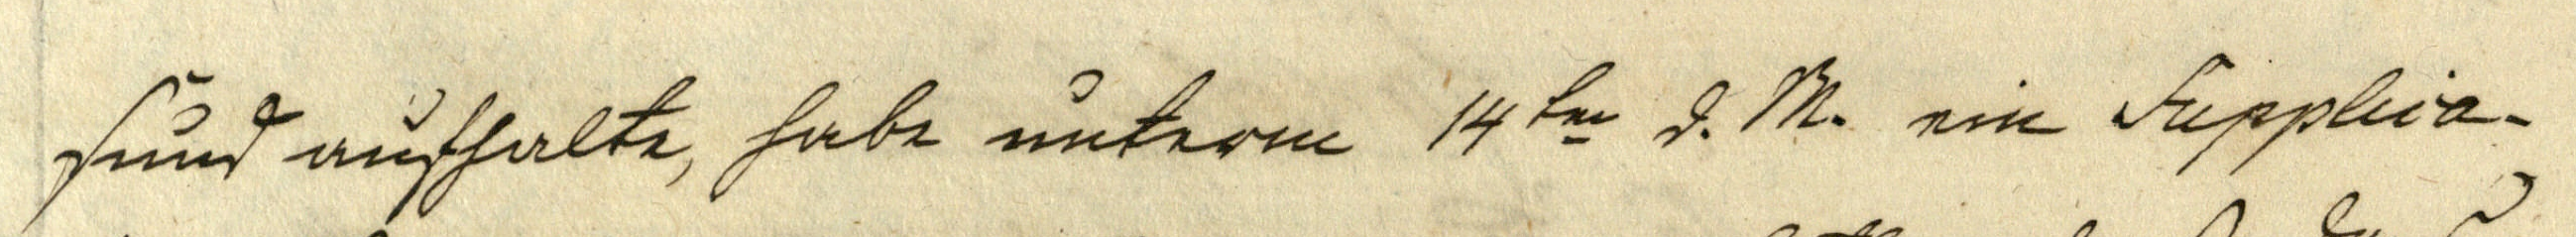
sund aufhalte, habe unterm 14en d. M. ein Supplica-
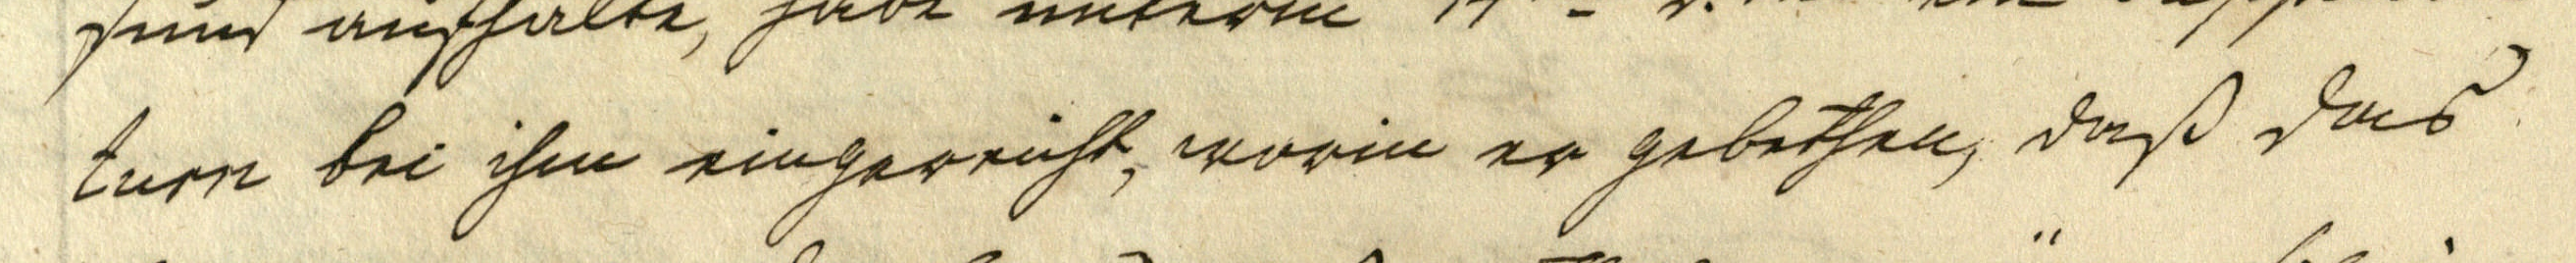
tum bei ihm eingereicht, worin er gebethen, daß das
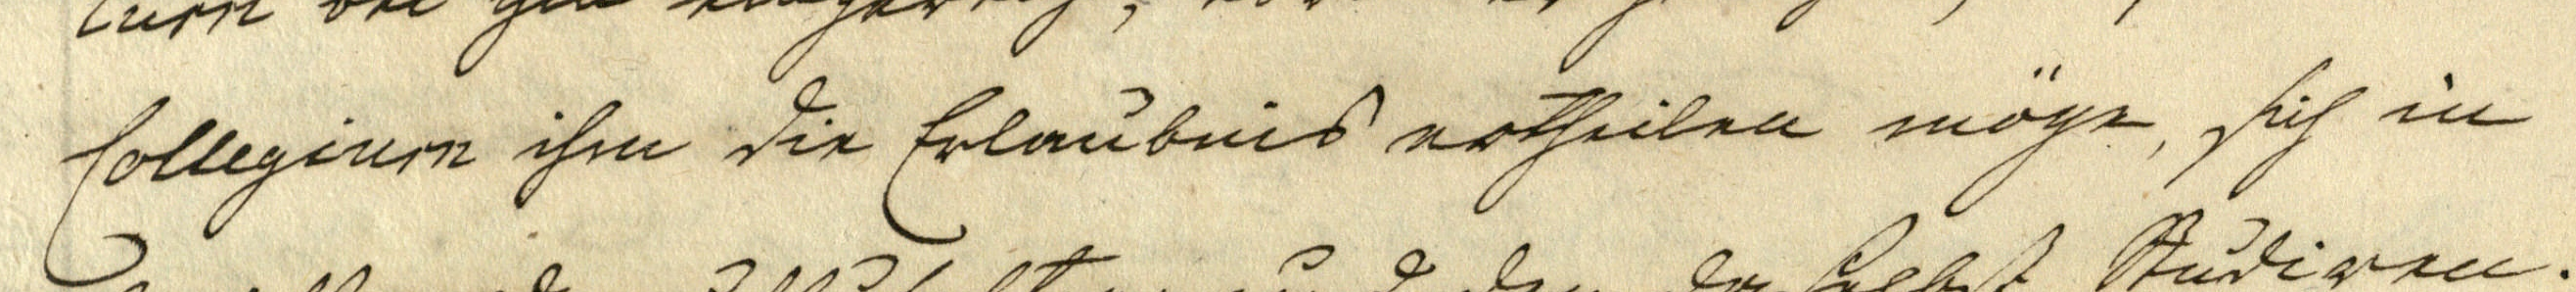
Collegium ihm die Erlaubnis ertheilen möge, sich in
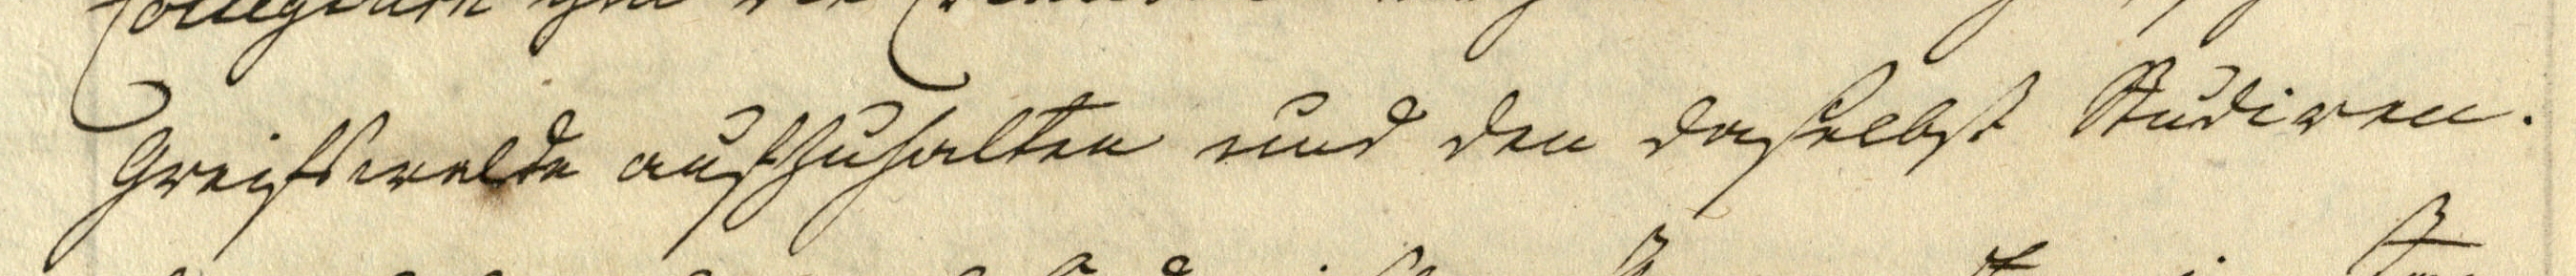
Greifswalde aufzuhalten und den daselbst Studiren-
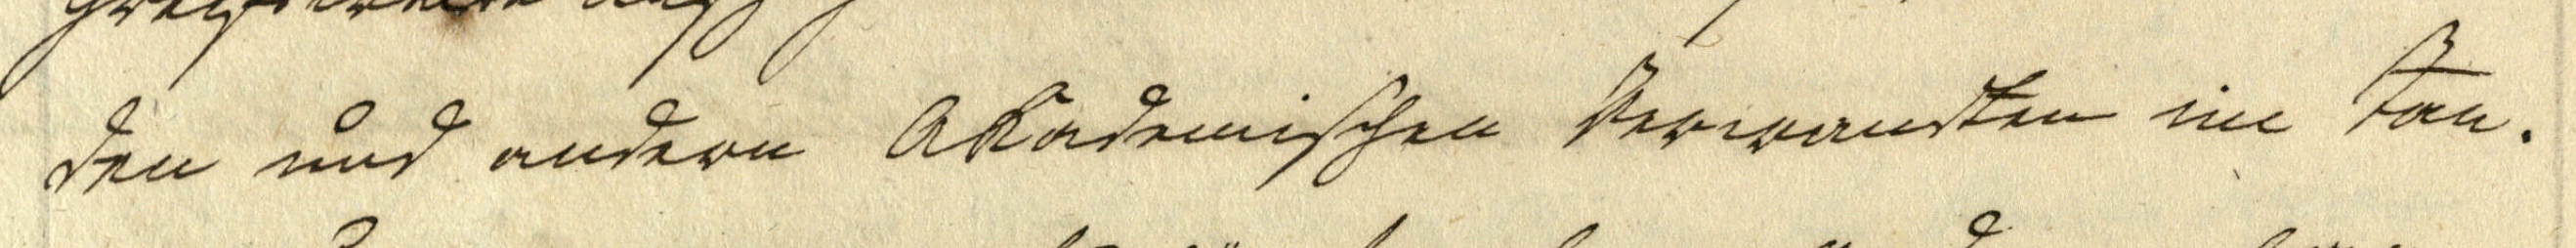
den und andern Akademischen Verwandten im Tan-
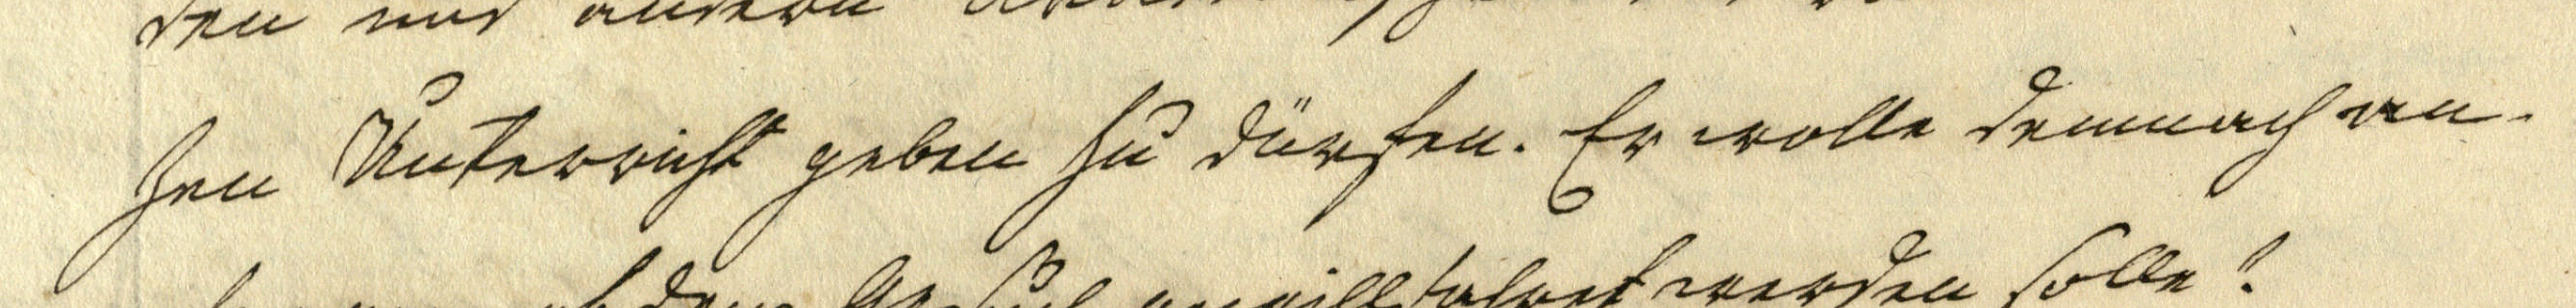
zen Unterricht geben zu dürfen. Er wolle demnach an-
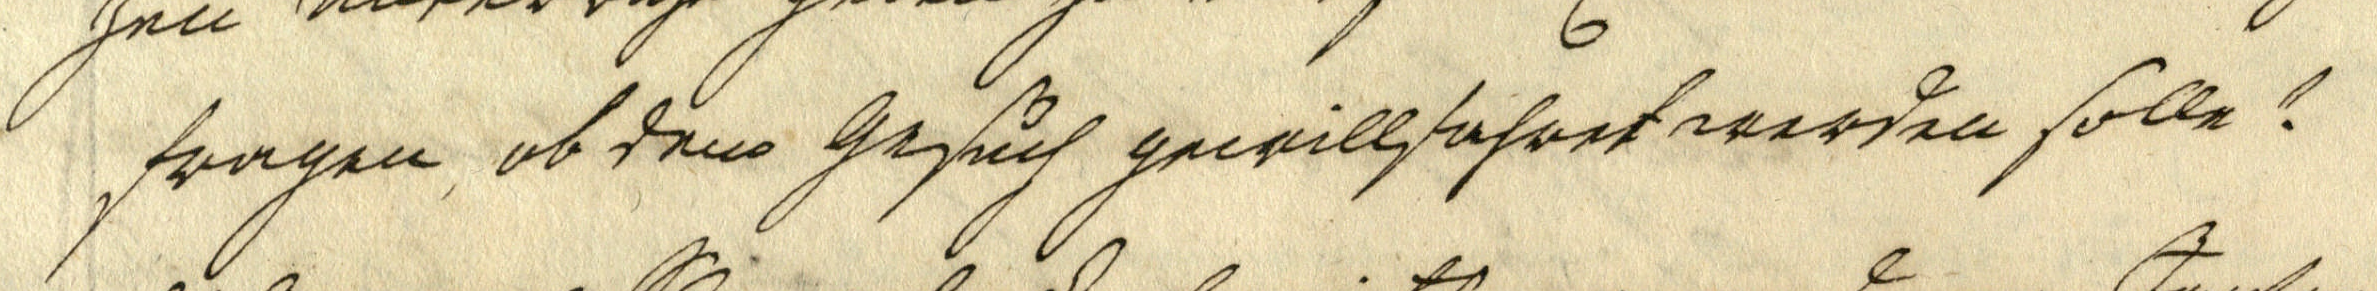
fragen, ob dem Gesuch gewillsahmt werden solle?
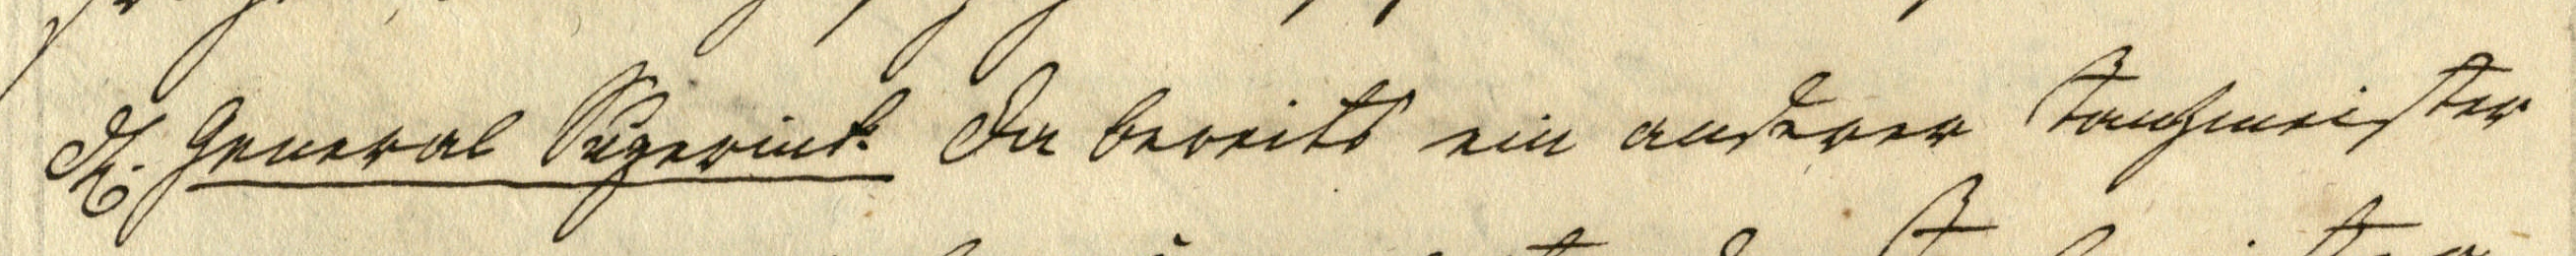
d.h. General Superint. Da bereits ein anderer Tanzmeister
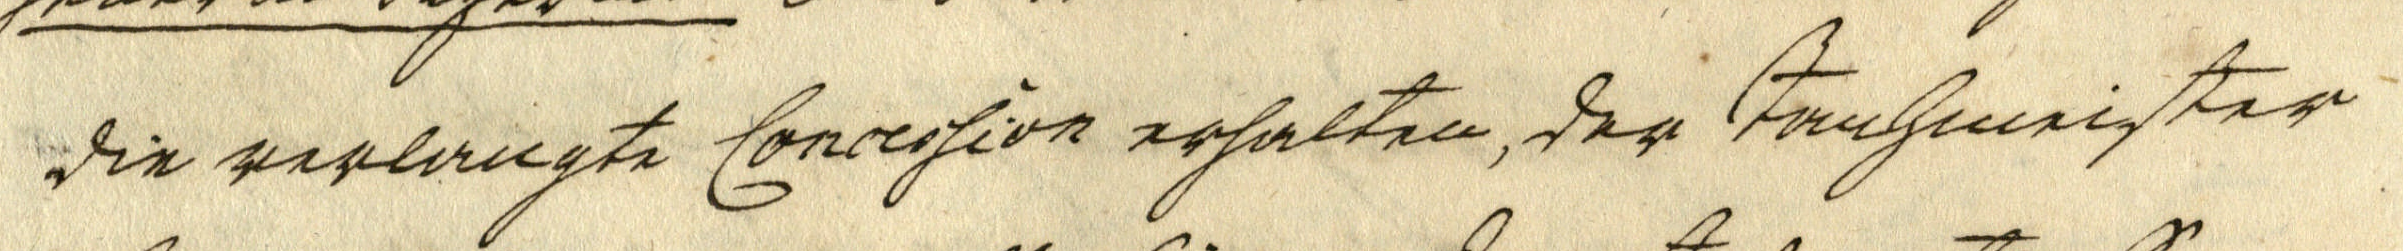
die verlangte Concession erhalten, der Tanzmeister
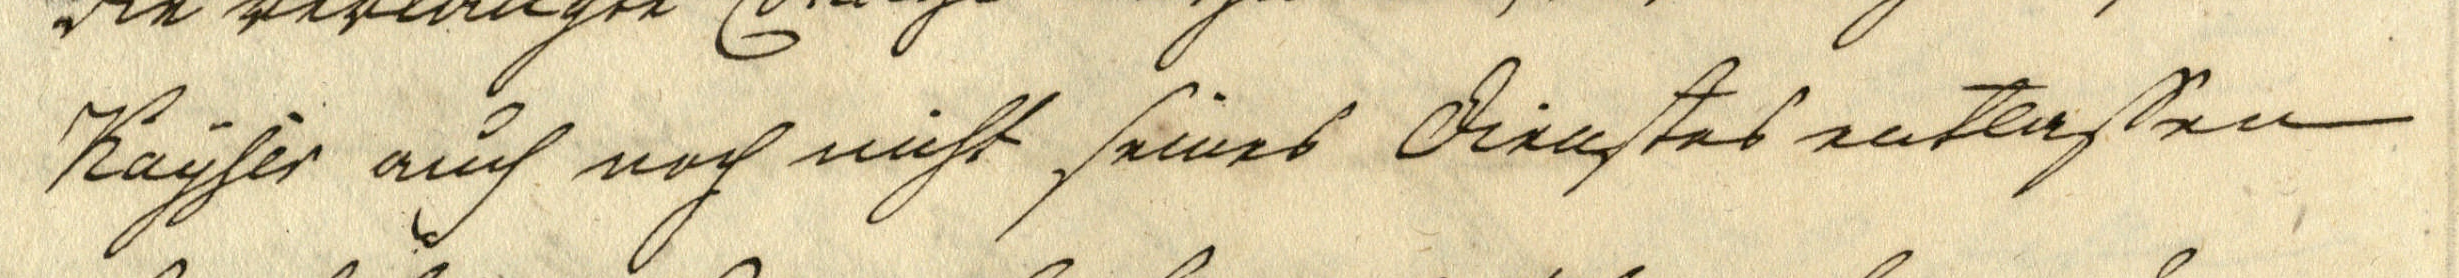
Kayer auch noch nicht seines Dienstes entlassen
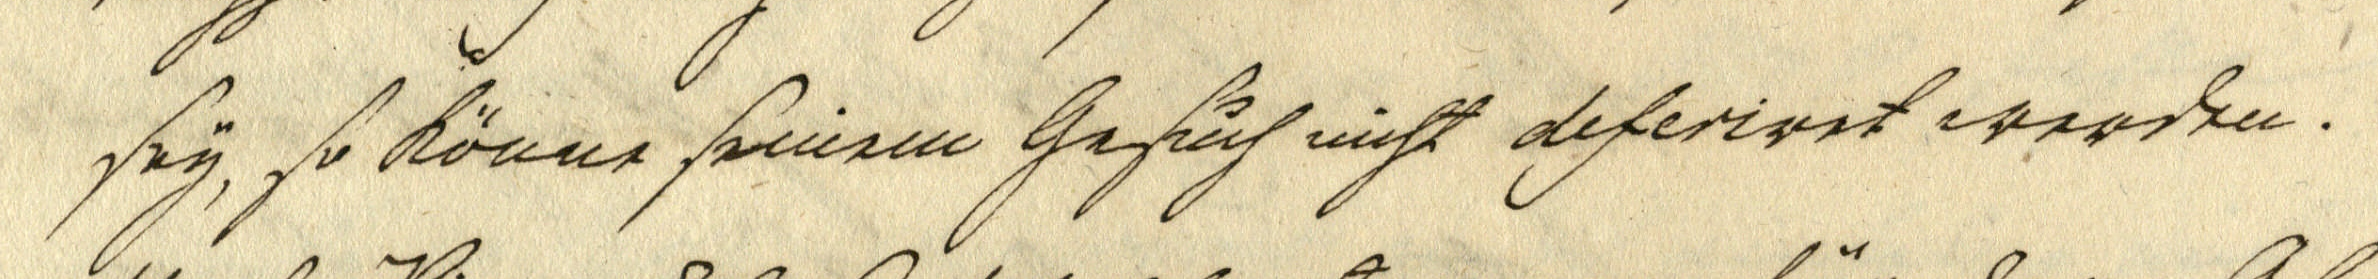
sey, so könne seinem Gesuch nicht deferiret werden.
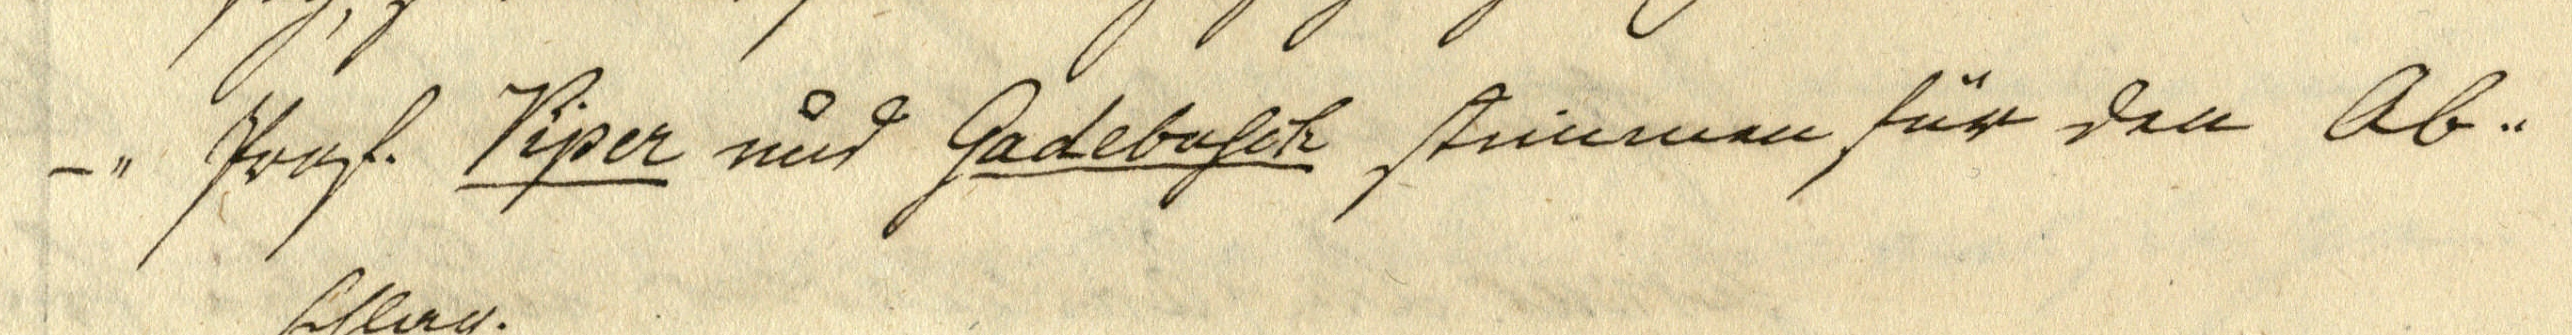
- " Prof. Piper und Gadebusch stimmen für den Ab-
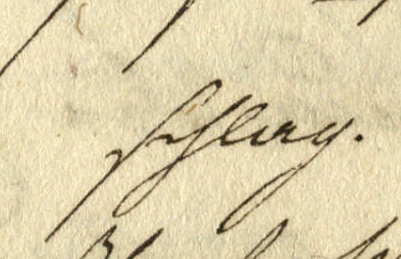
schlag.
